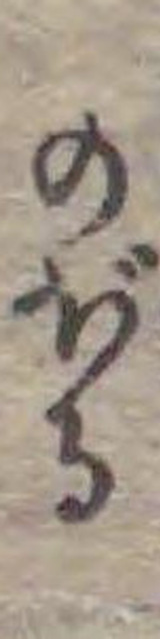のぼる
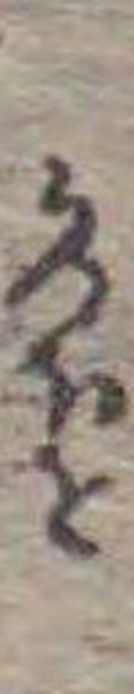かつほを

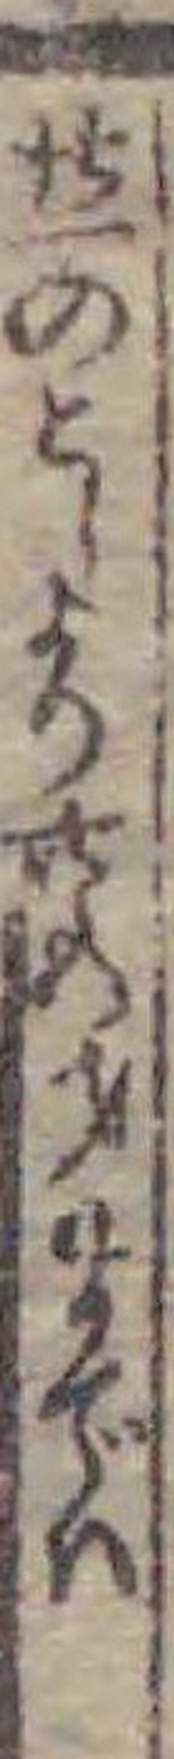廿一のとしより廿五才までは
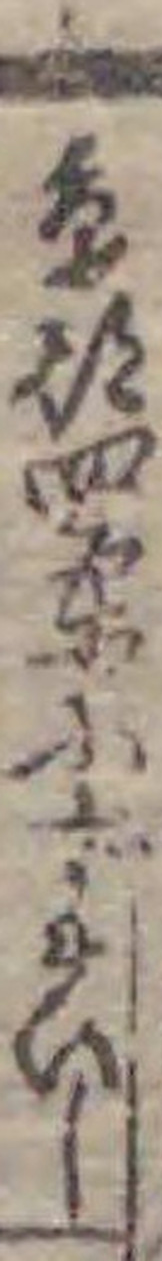京都四条にすまいし
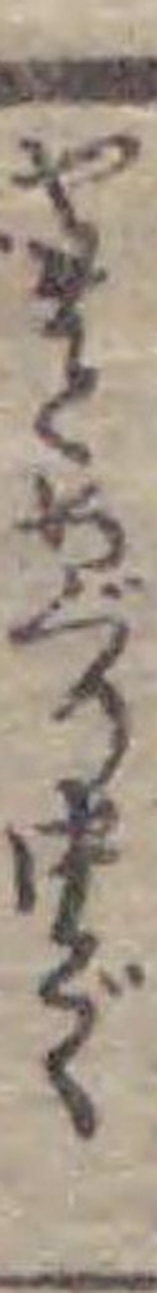やまとめぐり中ごく
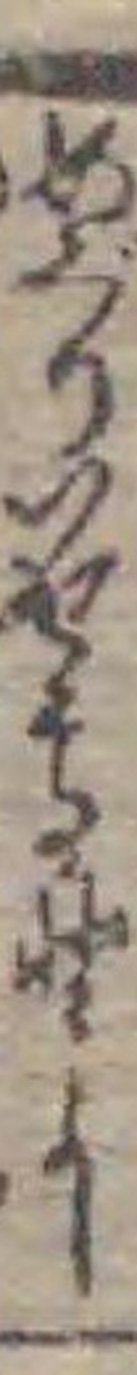めぐりいせ高野よし
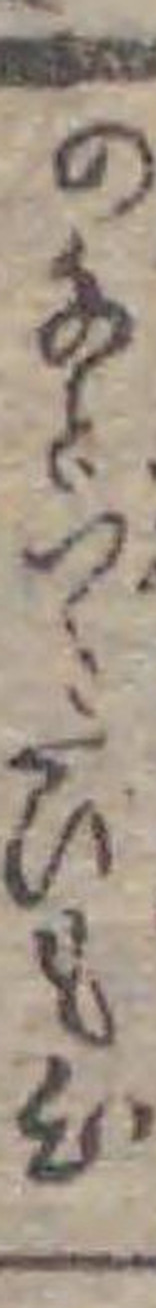のなどいくたびも心
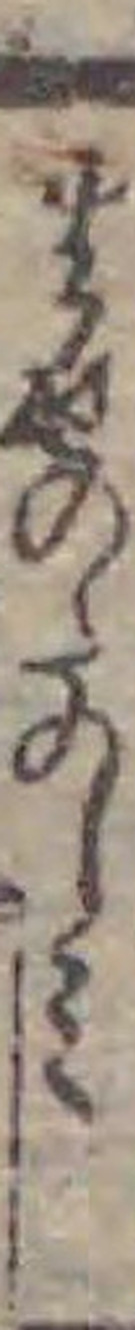まかせのたのしみ
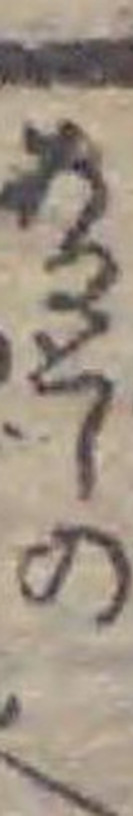あるとしの
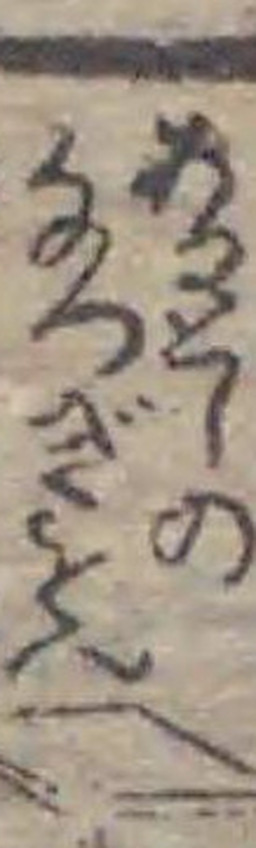なつぎをん
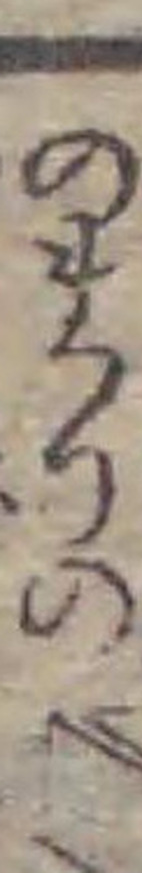のまつりの
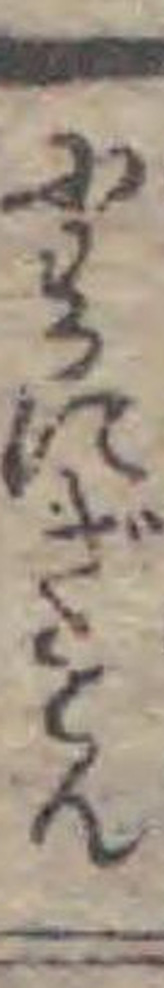にわかにぎをん
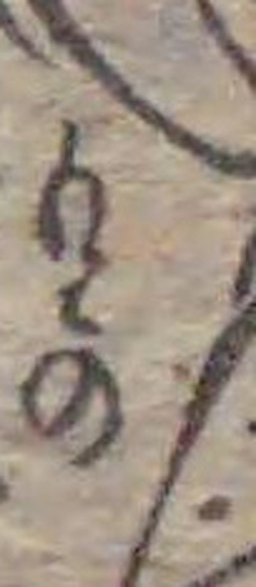もとの
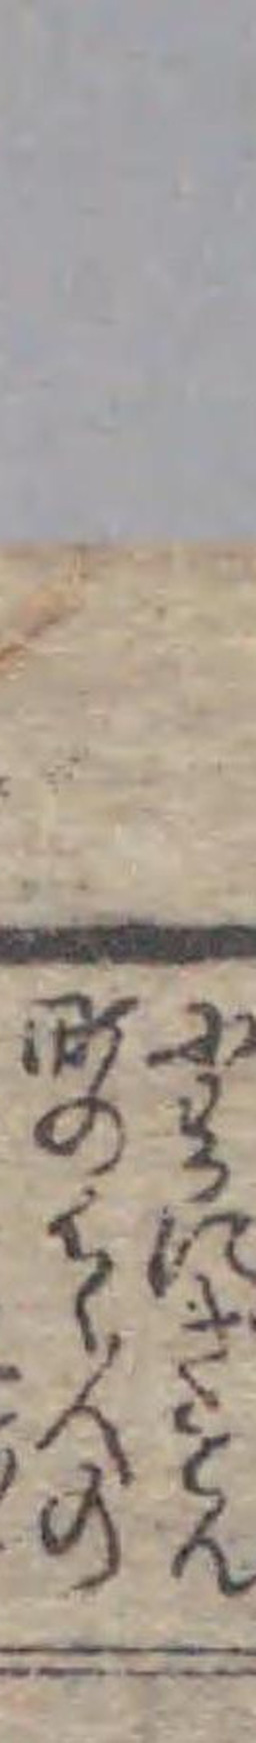町のはく？人の
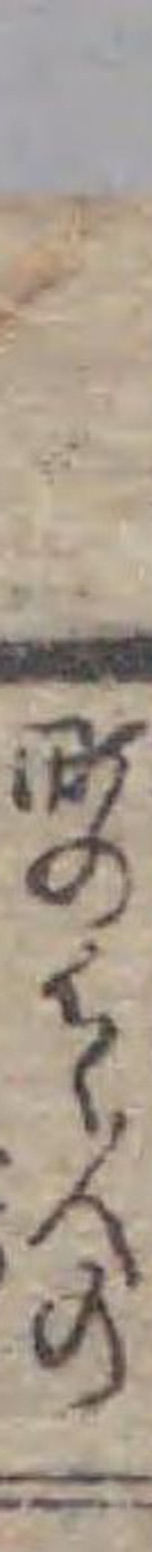町のはく？人の
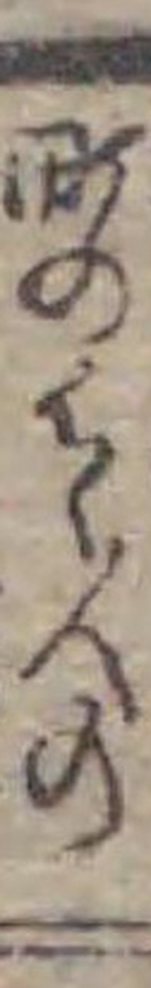町のはく？人の
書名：見徳一炊夢 : 3巻
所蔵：国立国会図書館 National Diet Library, JAPAN
